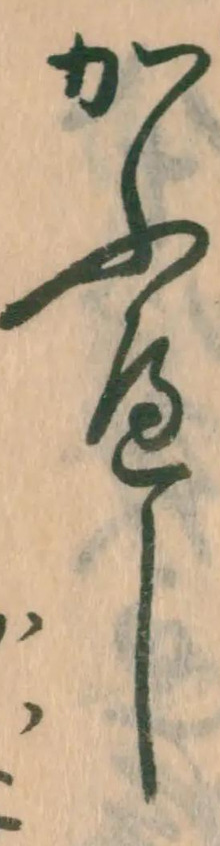がふへし
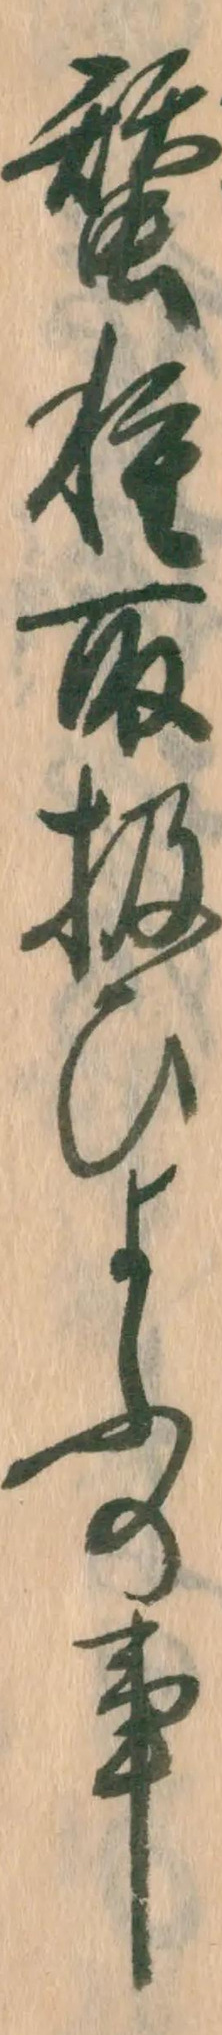蚕種取扱ひよふの事
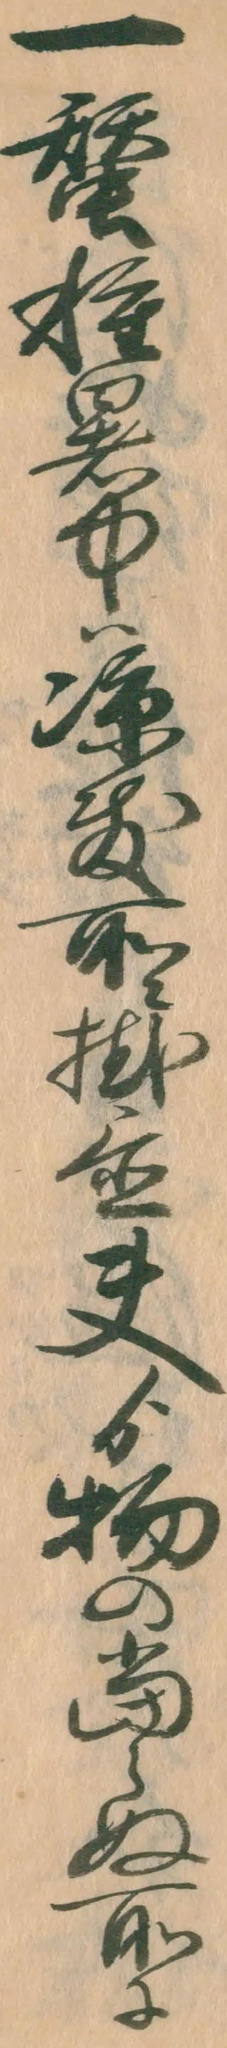一蚕種暑中は涼敷所に掛置夫ゟ物の当らぬ所に
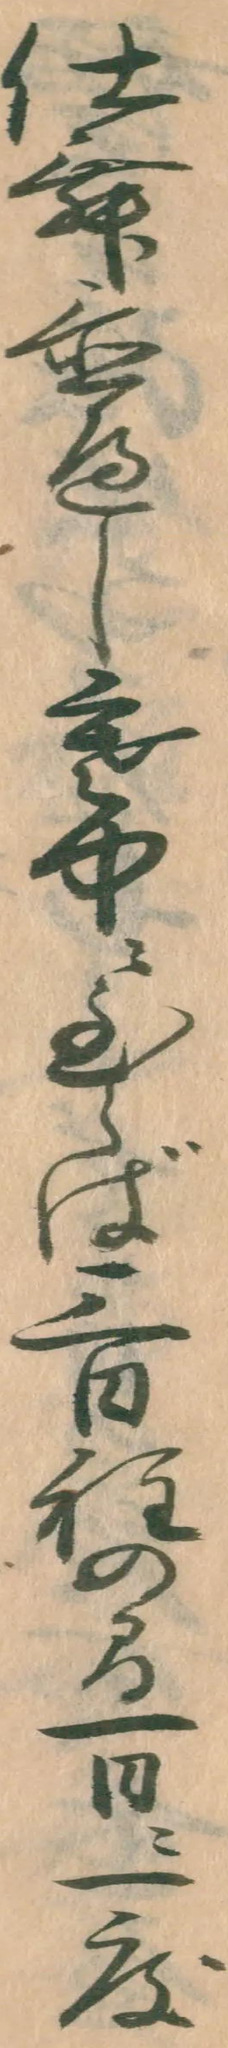仕舞置へし寒中に至らば三日程の間一日に一度
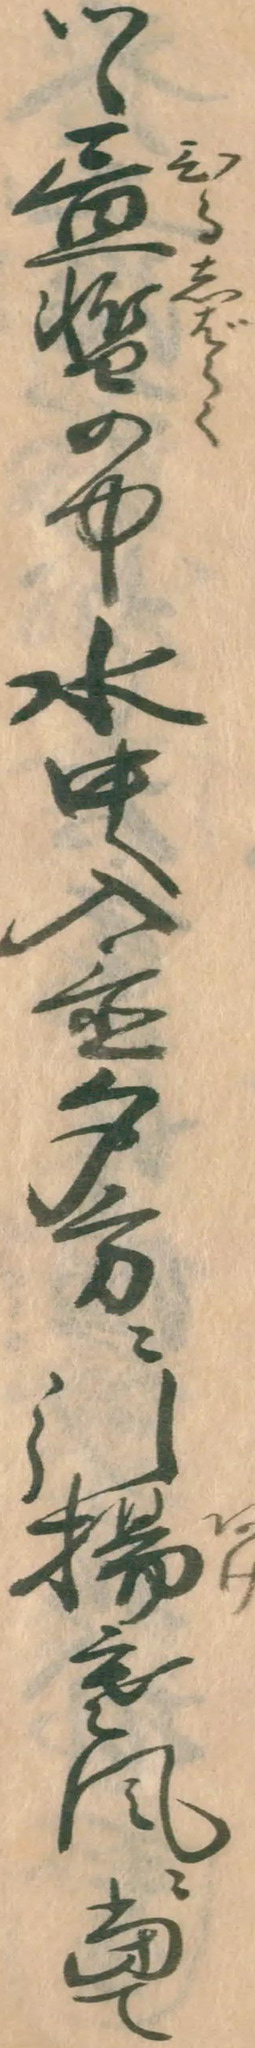つゝ昼暫の中水中へ入置夕方に引揚寒風に当て
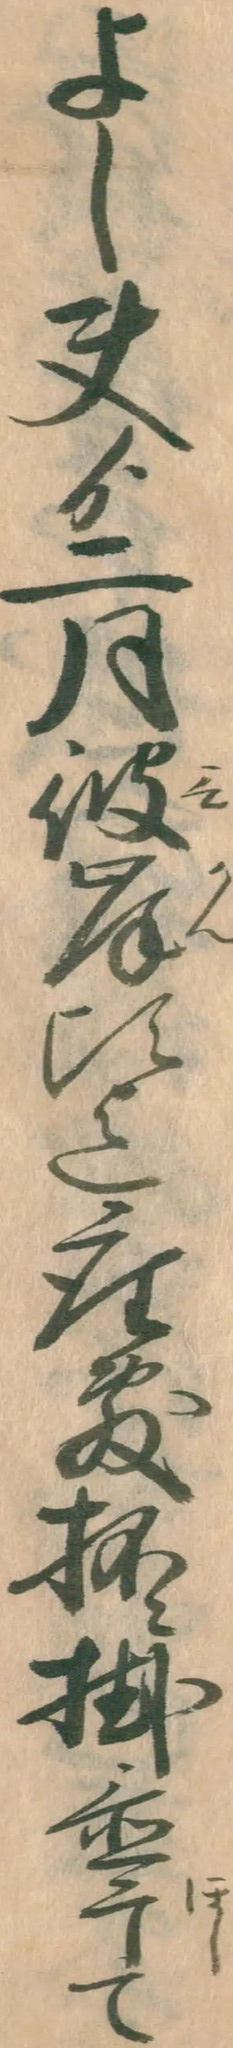よし夫ゟ二月彼岸頃迄座敷抔に掛置干て
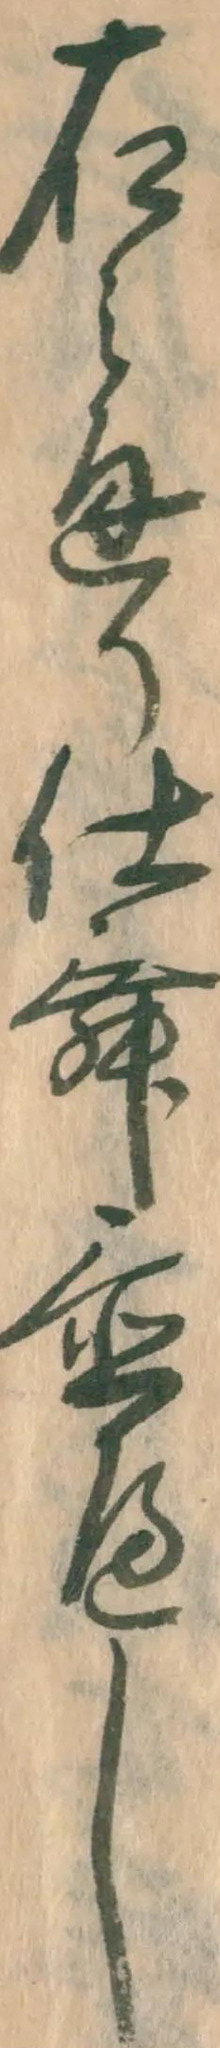右の通り仕舞置へし

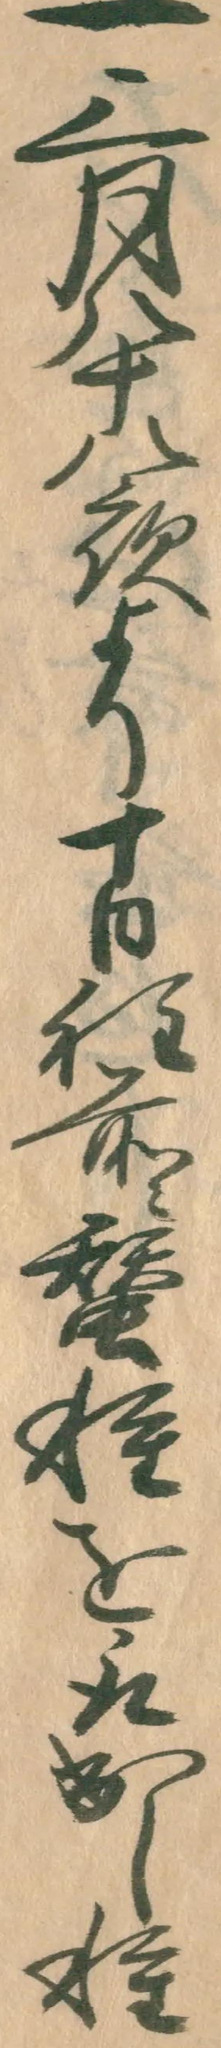一三月八十八夜より十日程前に蚕種を取出し種
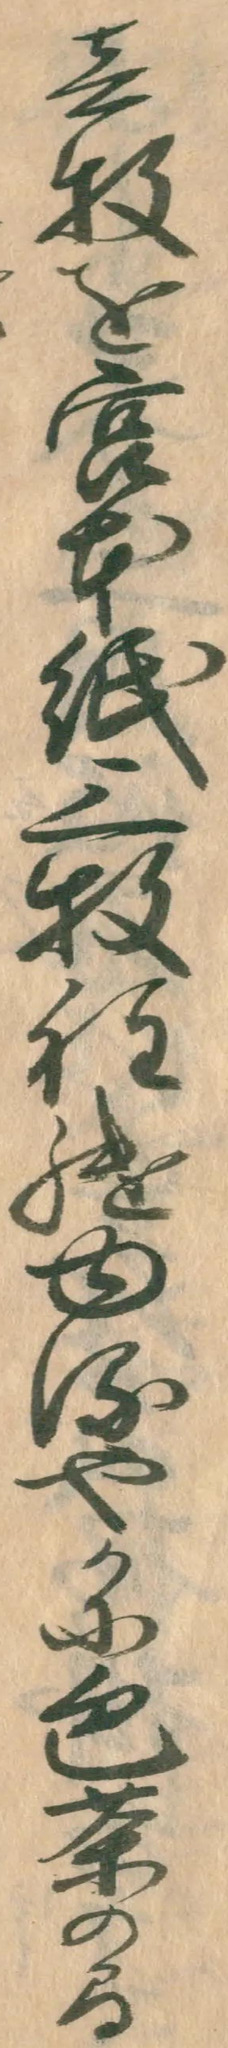壱枚を宮本紙三枚程継ゆるやかに包茶の間
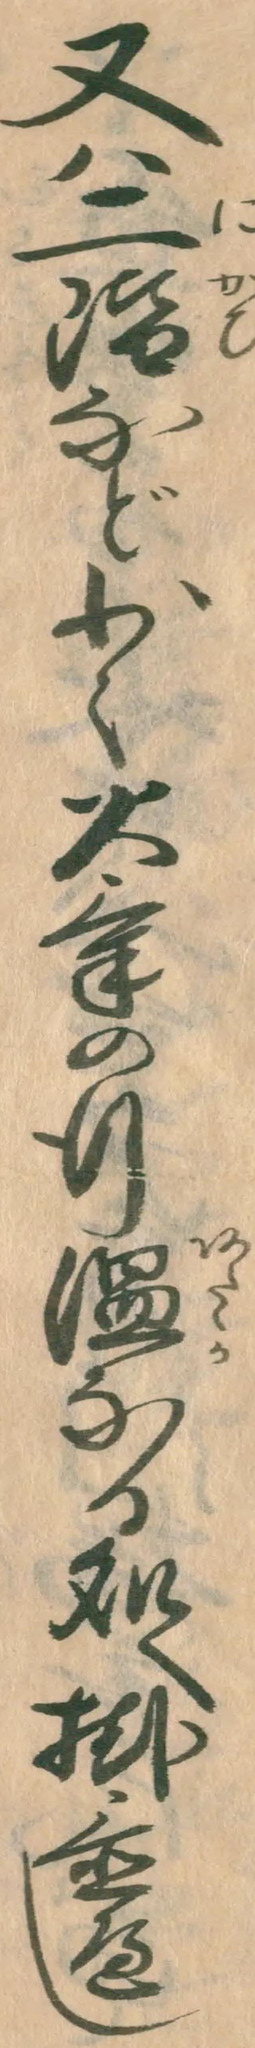又は二階など少々火気の行温なる処へ掛置へし
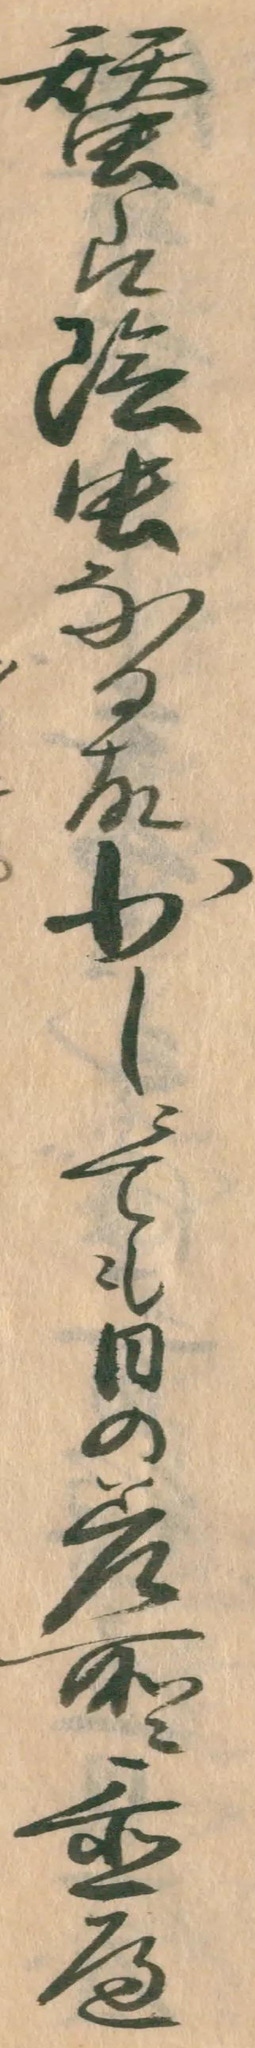蚕は陰虫なる故少しにても日の差所に置へ
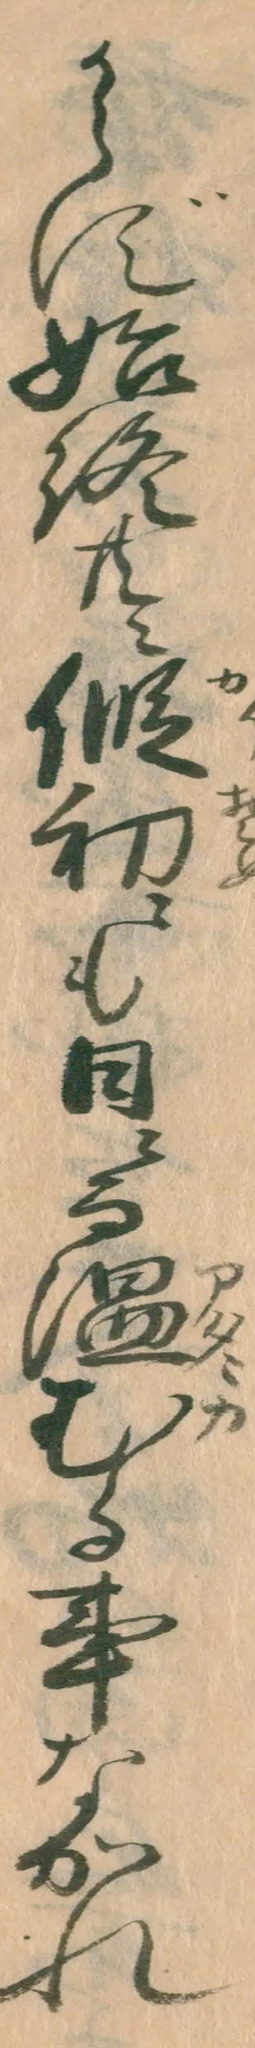からず始終共に仮初にも日にて温むる事なかれ
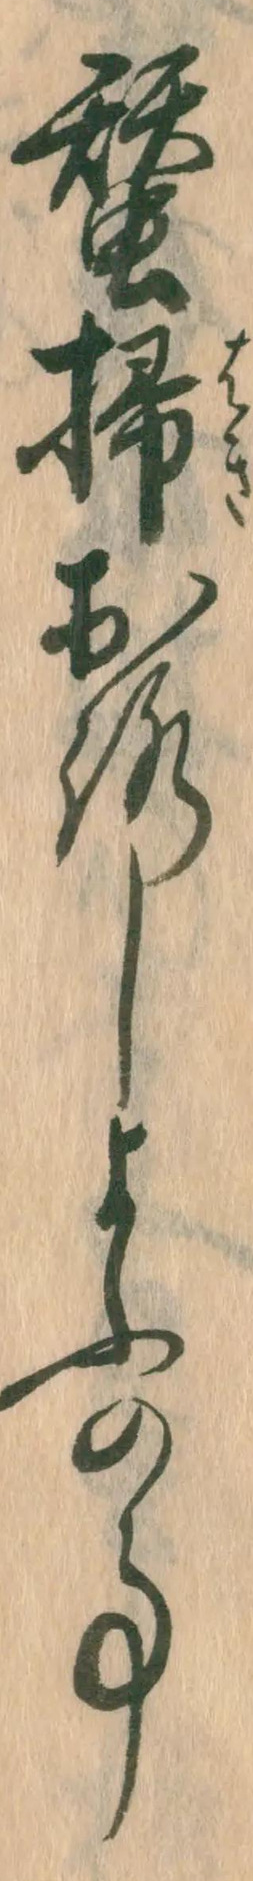蚕掃おろしよふの事
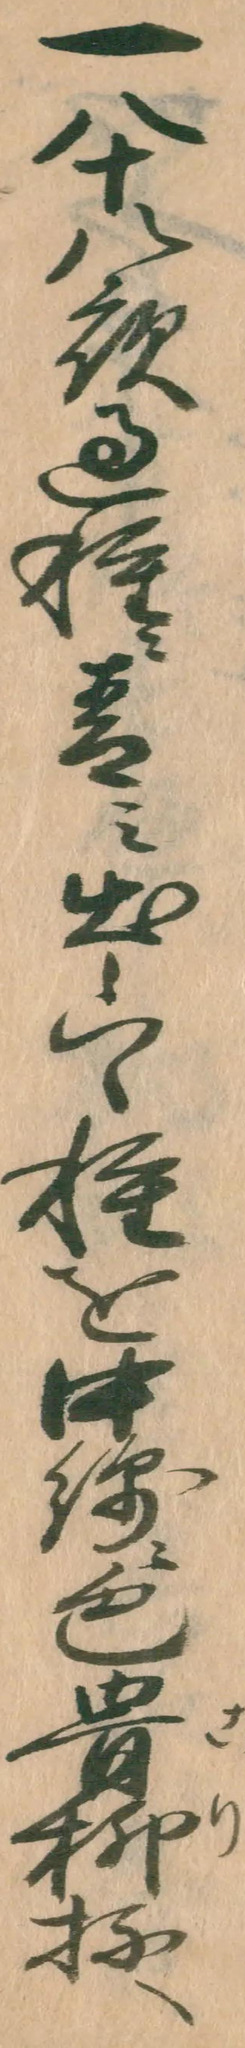一八十八夜過種に青み出しつゝ種を中綿に包骨柳抔へ
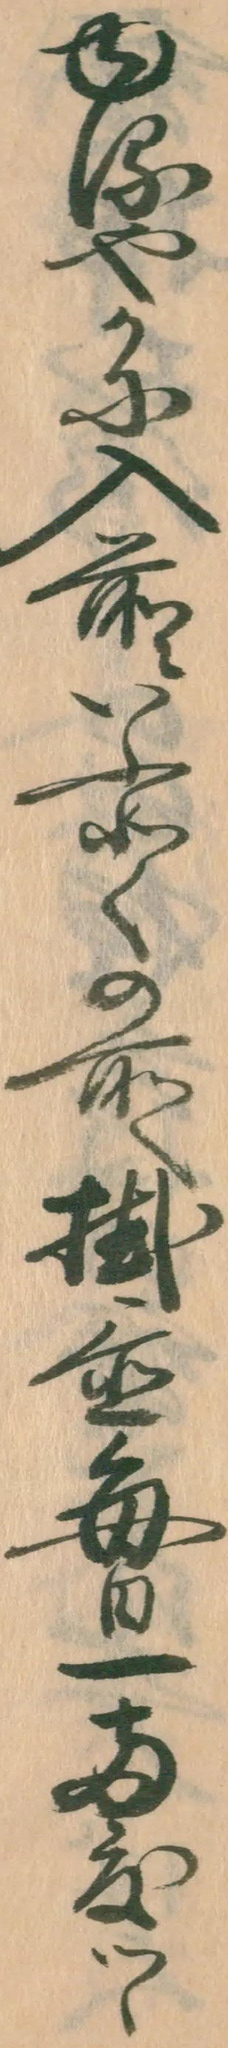ゆるやかに入前にいふ如くの所へ掛置毎日一両度つゝ
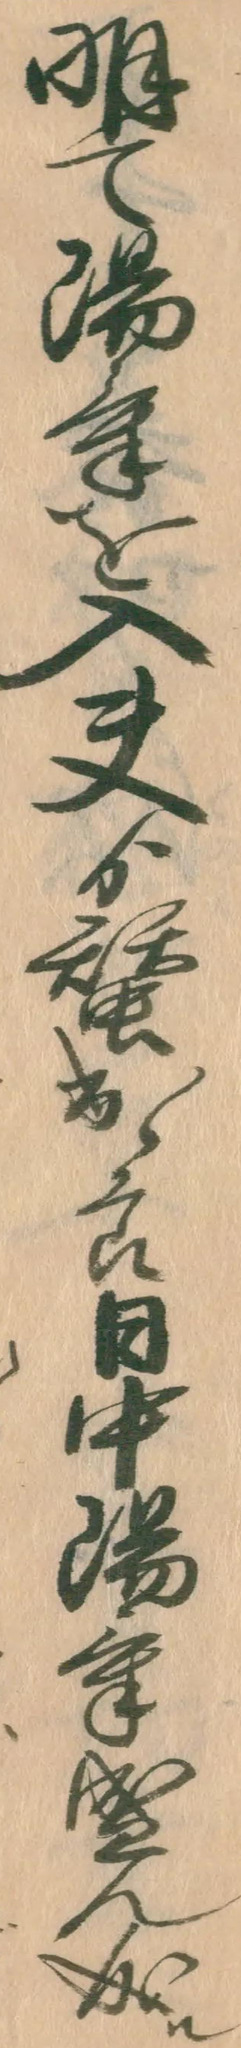明て陽気を入夫ゟ蚕出候節日中陽気盛ん成る
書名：養蚕録
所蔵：国立国会図書館 National Diet Library, JAPAN
